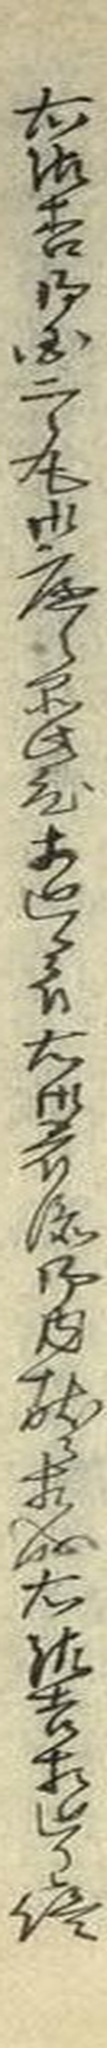右銀杏御国二ノ丸御庭之品此度相廻候ニ付右御肴添御内献ニ相成右銀杏相廻り候儘
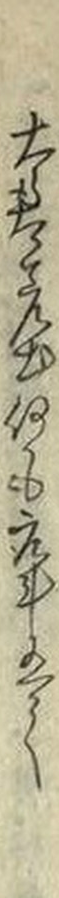大奥へ差出何も取計有之

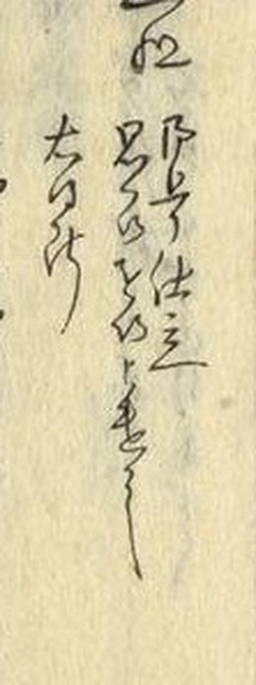思召を以被遣之
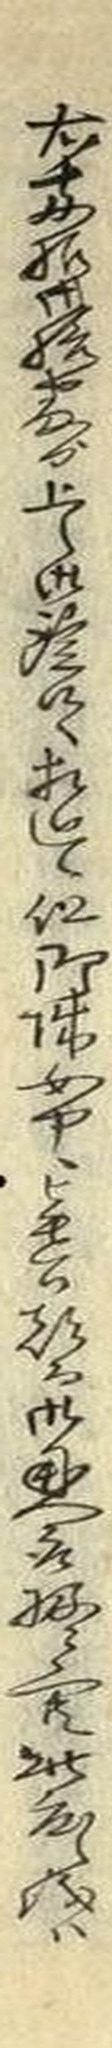右両様御膳番ゟ上之御錠口へ相廻候但御城女中へ被遣ハ都而御用人取扱ニ候へ共此度之儀ハ
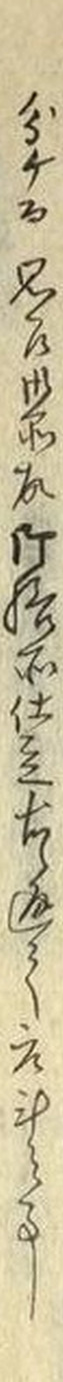分ケ而思召御品故御膳所仕立右之通之取計之事
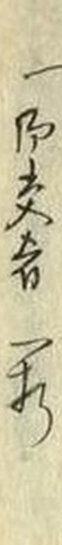御交肴一折
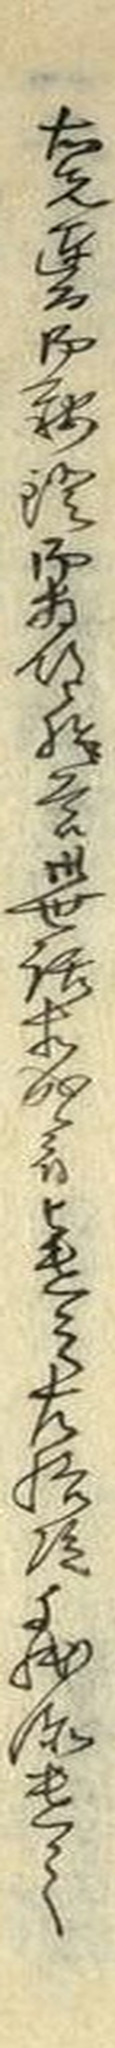右先達而御鞍鐙御拝領被遊候節御世話相成候ニ付被遣之左膳殿手紙添遣之
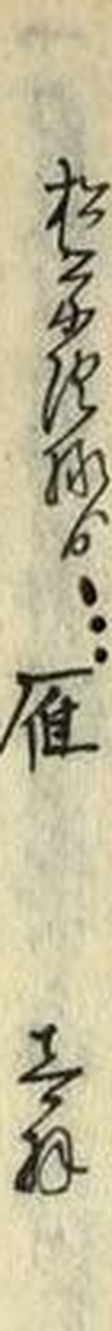松栄院様ゟ雁壱羽
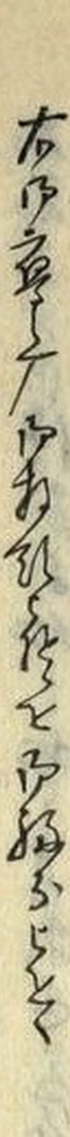右御鷹之雁御拝領被遊候を御福分被進候
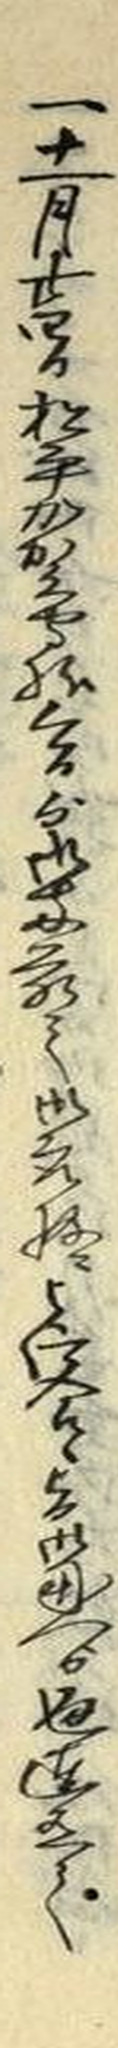一十一月廿四日松平加賀守様今日ゟ御両敬之御取扱ニ被仰合候旨御用人ゟ通達有之
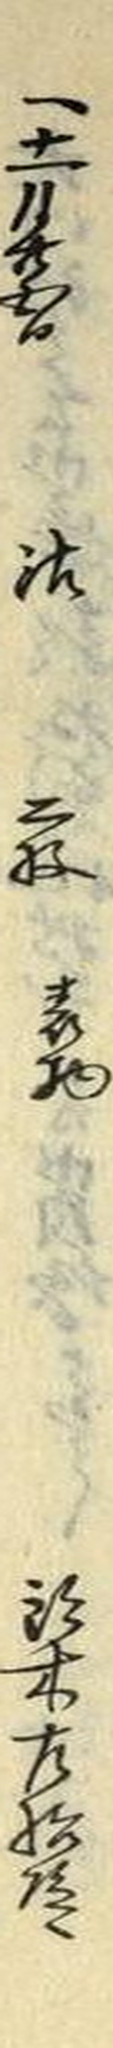一十一月廿五日銀二枚表物鈴木左膳殿へ
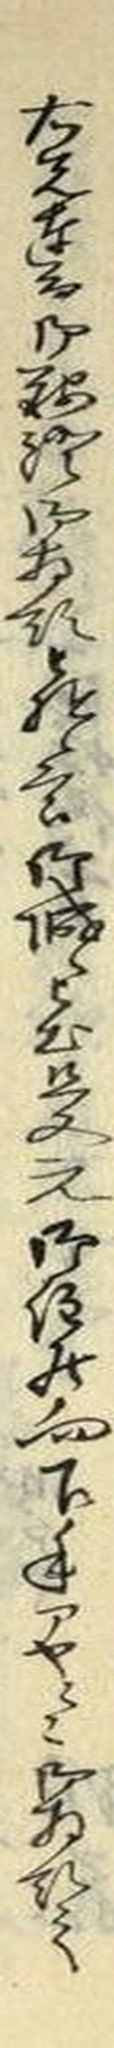右先達而御鞍鐙御拝領被遊候節御城へ被出且又元御住居向下手部屋々々御拝領之
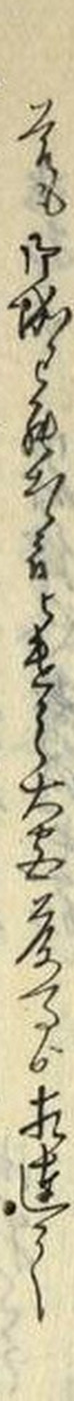節も御城へ被罷出候ニ付被遣之大宮藤馬ゟ相達之
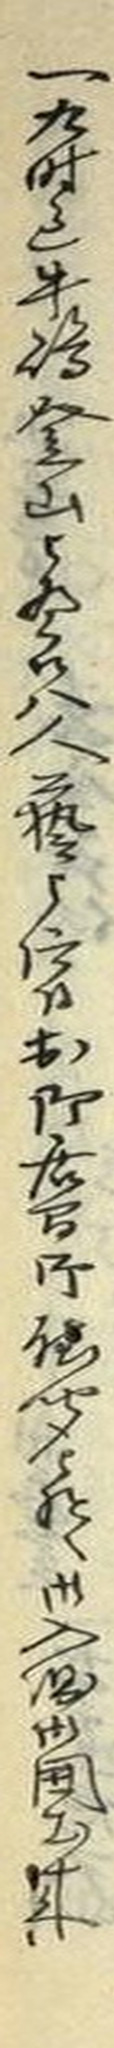一九時過牛嶋登山被為召八人芸被仰付御於御居間御聴聞被遊候御入側御囲出来
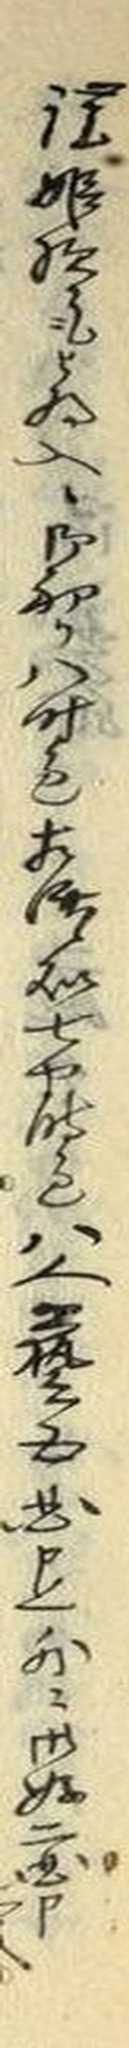謹姫様ニも被為入候御初り八時過相済候処七半時過八人芸五曲申上外ニ御好二曲申上之
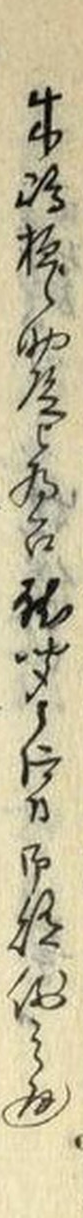成嶋桓之助殿被為召聴聞被仰付御賄例之通
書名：少傅日録抄（斉善付側向頭取日記、在府）
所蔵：福井県文書館 Fukui Prefectural Archives
